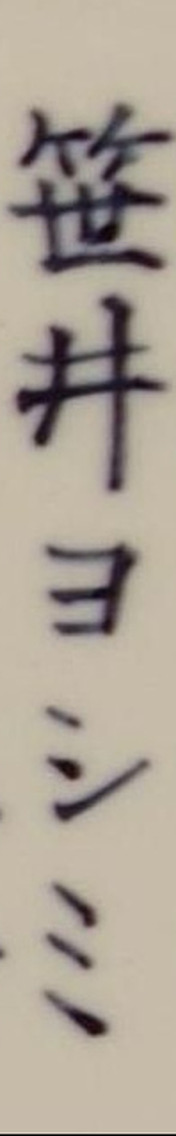笹井ヨシミ
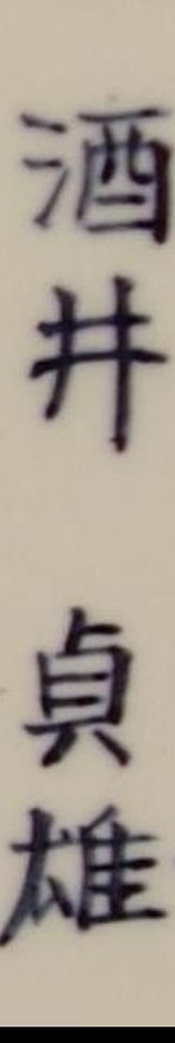酒井貞雄
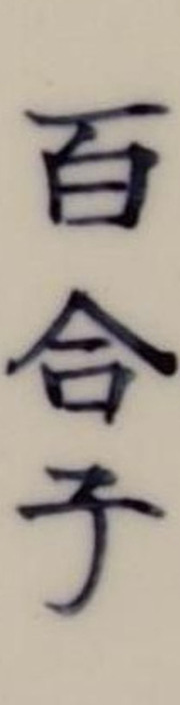百合子
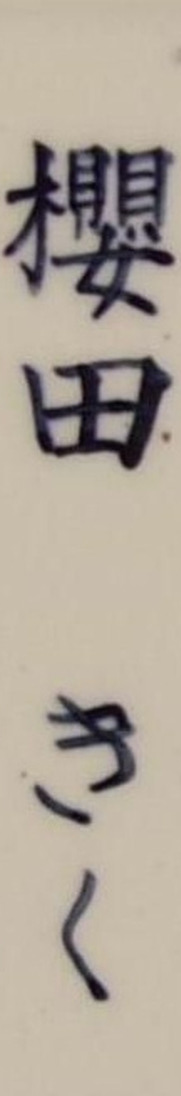桜田きく

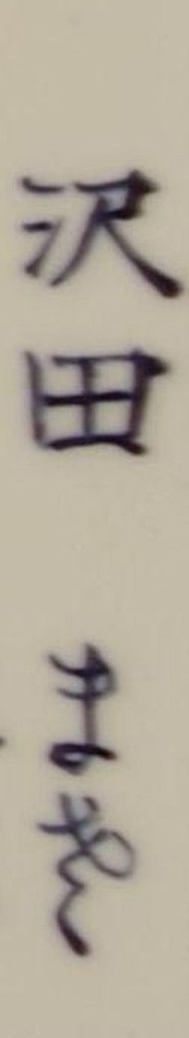沢田まさ
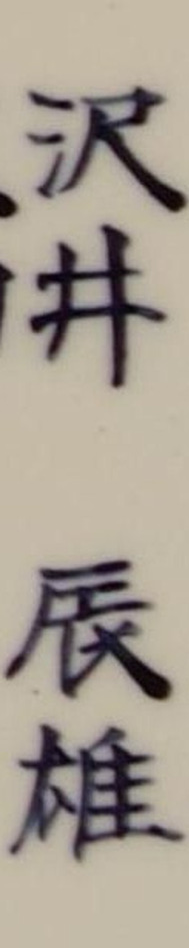沢井辰雄
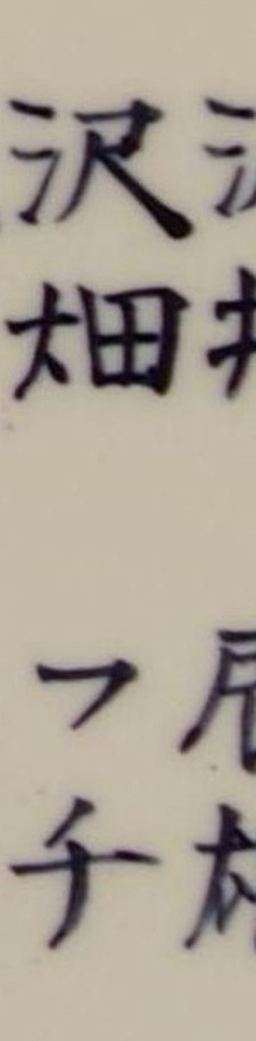沢畑フチ
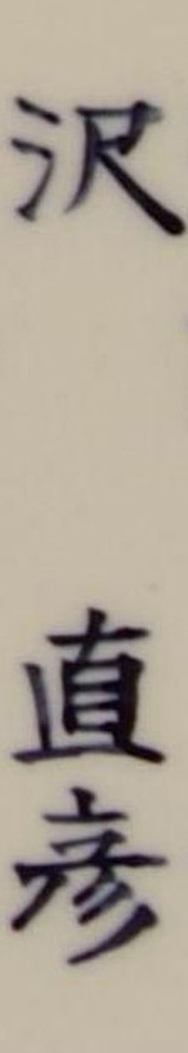沢直彦
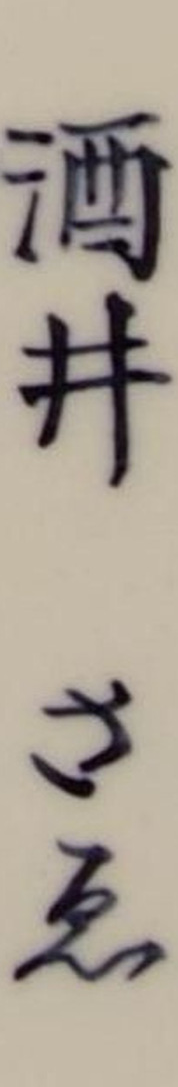酒井さえ
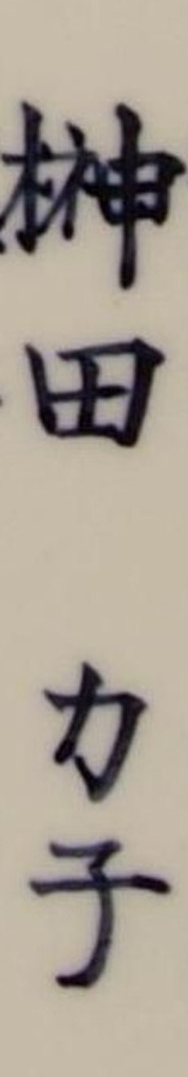神田力子
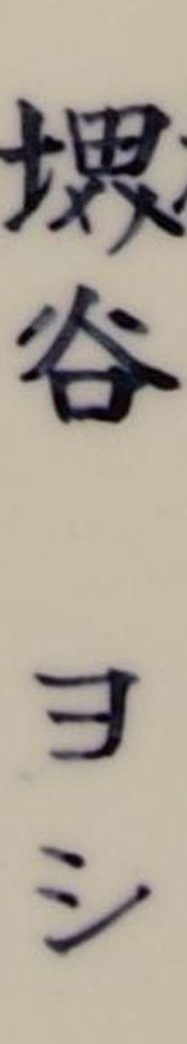堺谷ヨシ
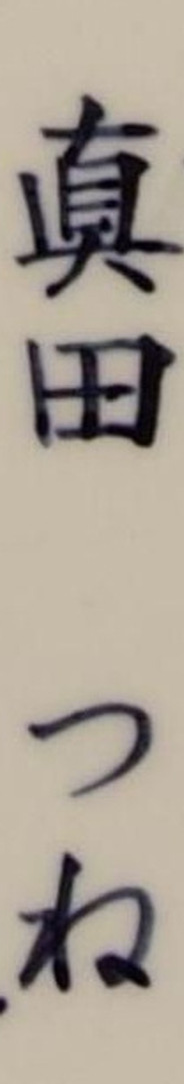真田つね
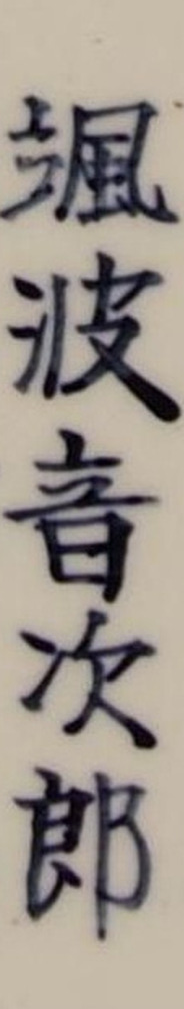颯波音次郎
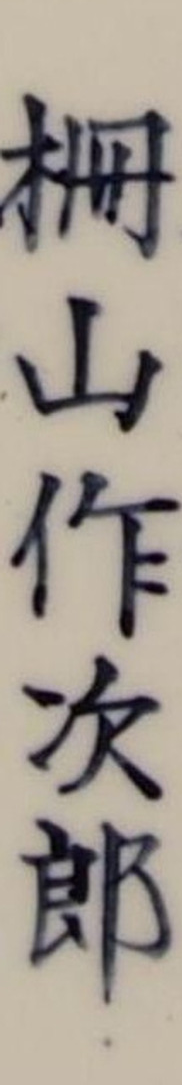柵山作次郎
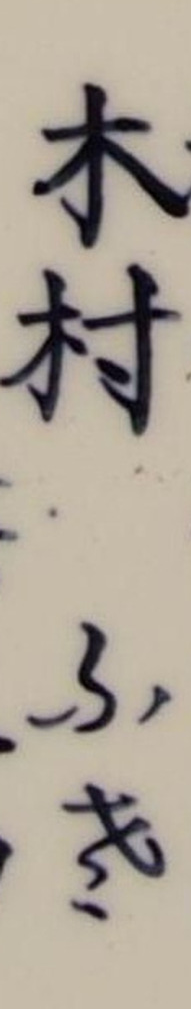木村ふさ
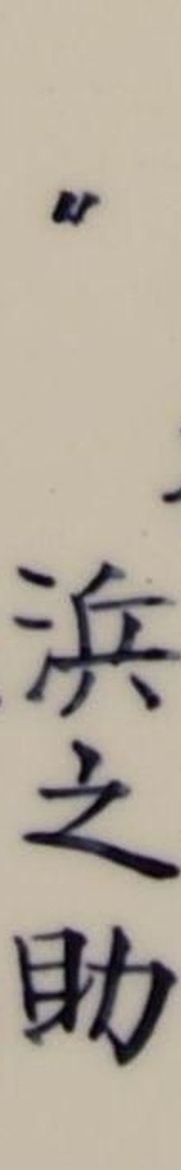兵之助
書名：E~L
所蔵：高野山金剛峯寺
